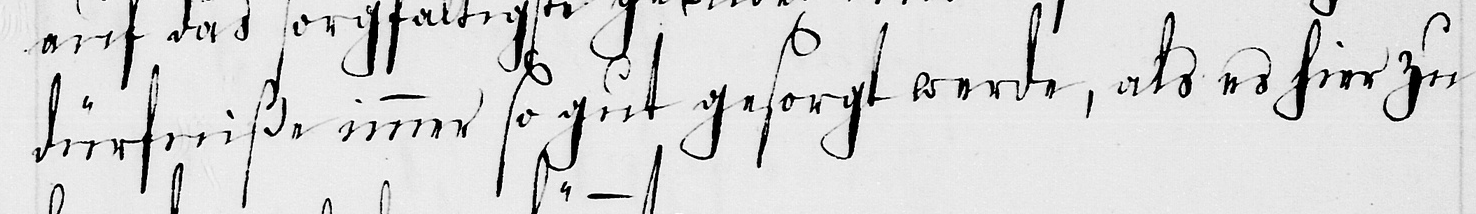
edürfniße immer so gut gesorgt werde, als es hier zu
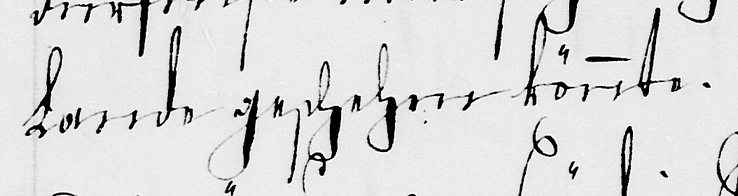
Lande geschehen könnte.
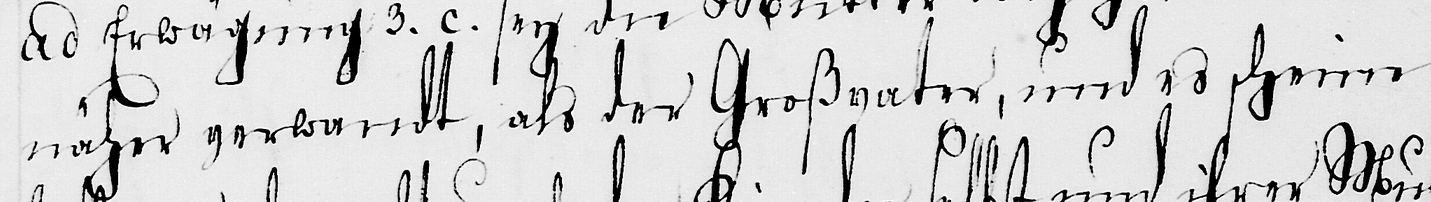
näher verwandt, als der Großvater, und es scheine
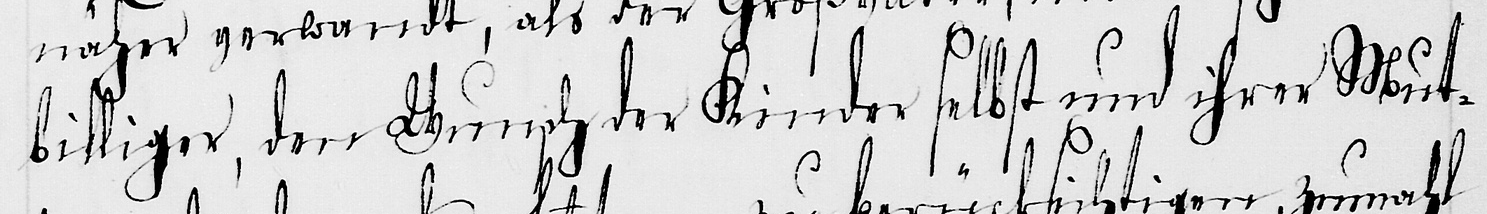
billiger, den Wunsch der Kinder selbst und ihrer Mut¬
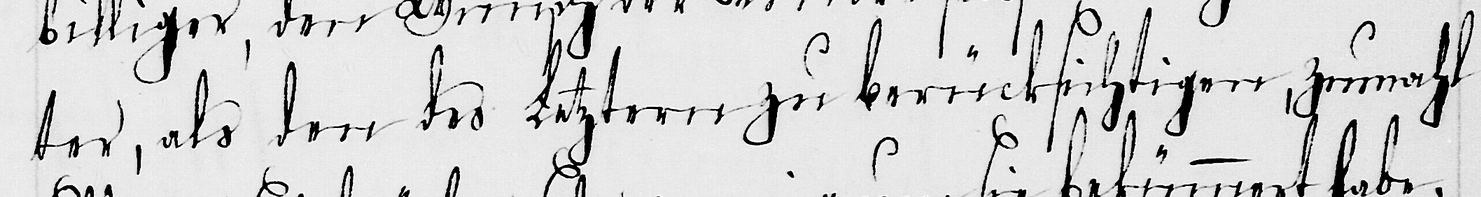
ter, als den des Letztern zu berücksichtigen, zumahl
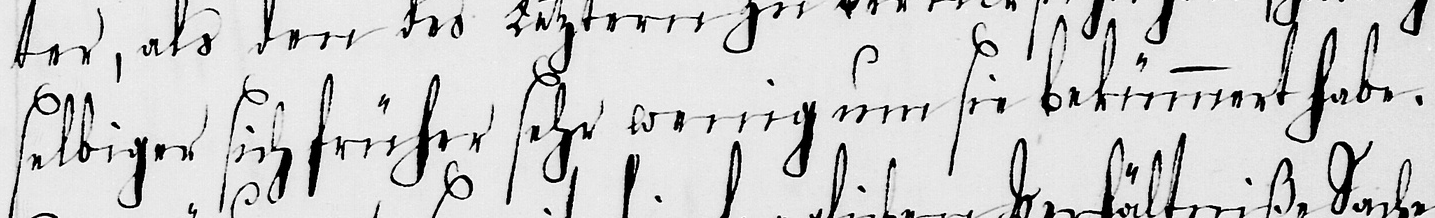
selbiger sich früher sehr wenig um sie bekümmert habe.
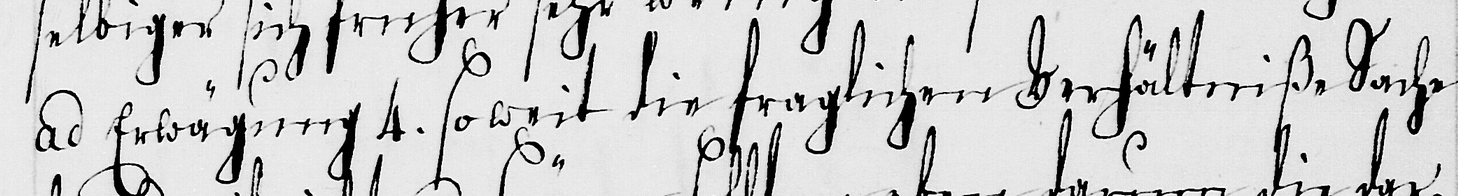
ad Erwägung 4. soweit die fraglichen Verhältniße Sache
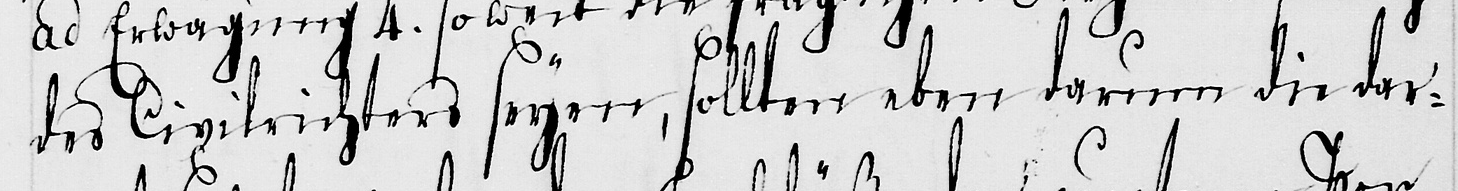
des Civilrichters seyen, sollten eben darum die dar¬
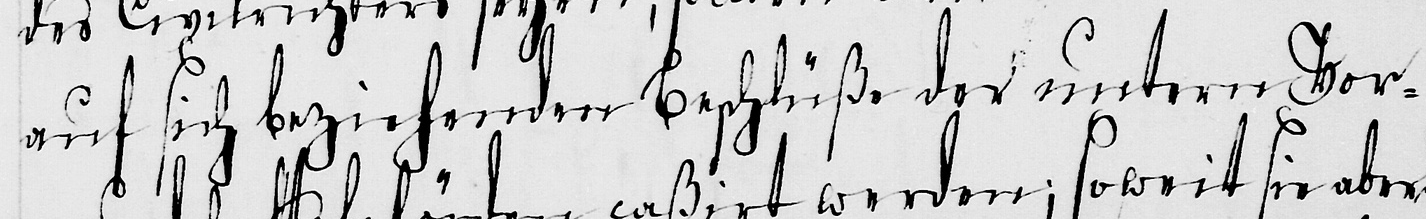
auf sich beziehenden Beschlüße der untern Vor¬
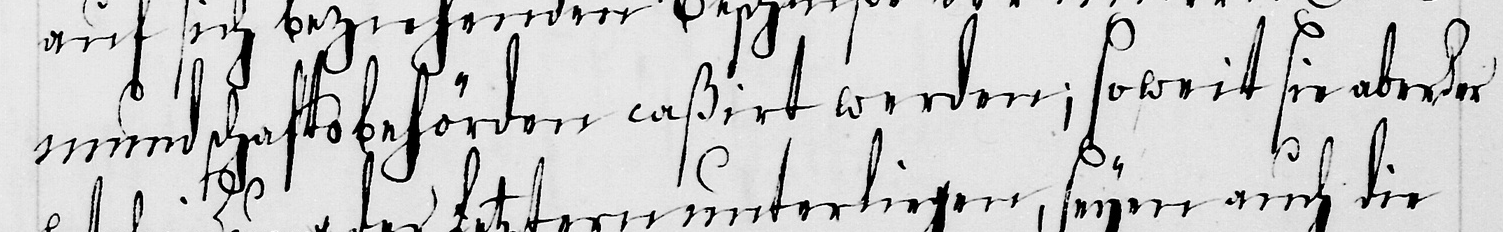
mundschaftsbehörden caßirt werden; soweit sie aber
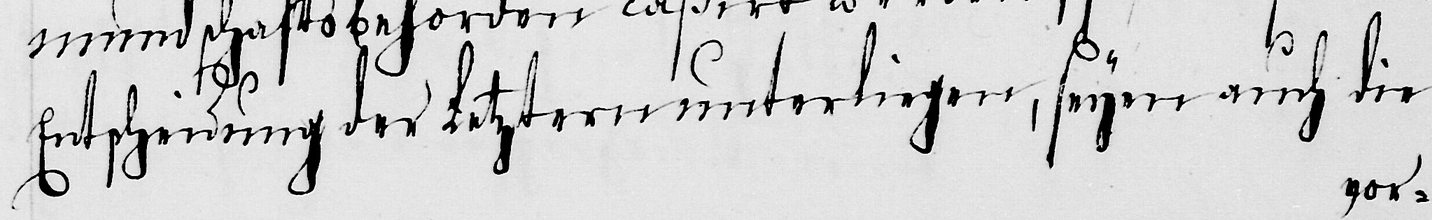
Entscheidung der Letztern unterliegen, seyen auch die
